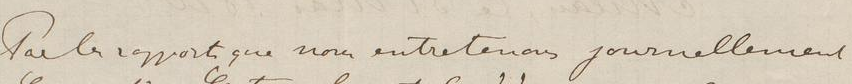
Par le rapport que nous entretenons journellement
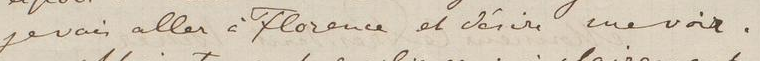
je vais aller à Florence et désire me voir.
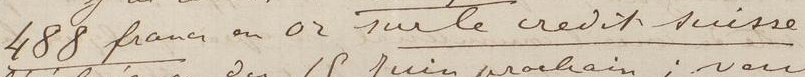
488 francs en or sur le credit suisse, à
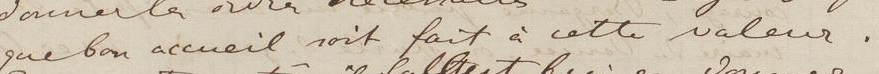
que bon accueil soit fait à cette valeur.
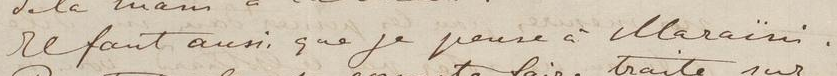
Il faut aussi que je pense à Maraini.
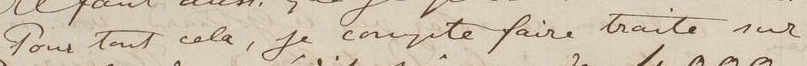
Pour tout cela, je compte faire traite sur
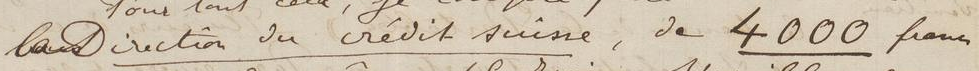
la Direction du crédit suisse, de 4000 francs
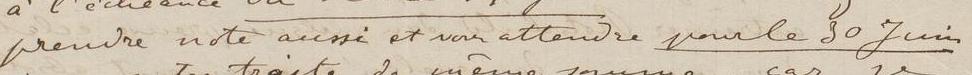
prendre note aussi et vous attendre pour le 30 Juin
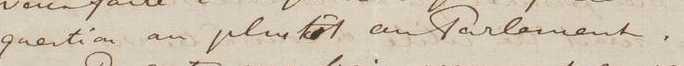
question au plus tôt au Parlement.
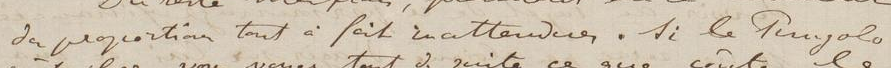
des proportions tout à fait inattendues. Si le Pungolo
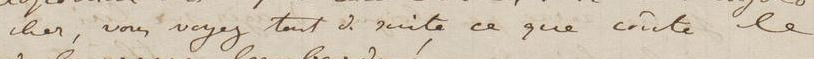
cher, vous voyez tout de suite ce que coûte le
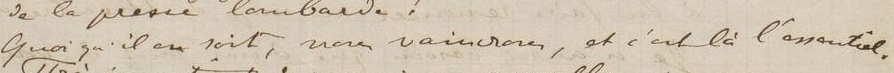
Quoi qu'il en soit, nous vaincrons, et c'est là l'essentiel.
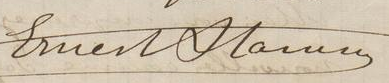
Ernest Stamm
